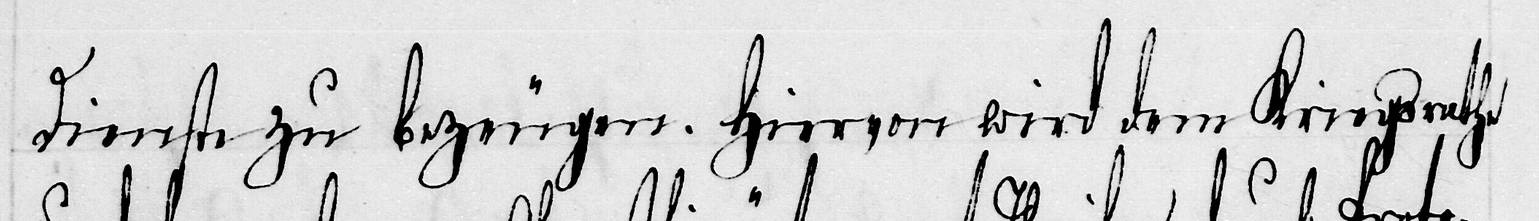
Dienste zu bezeugen. Hiervon wird dem Kriegsrathe
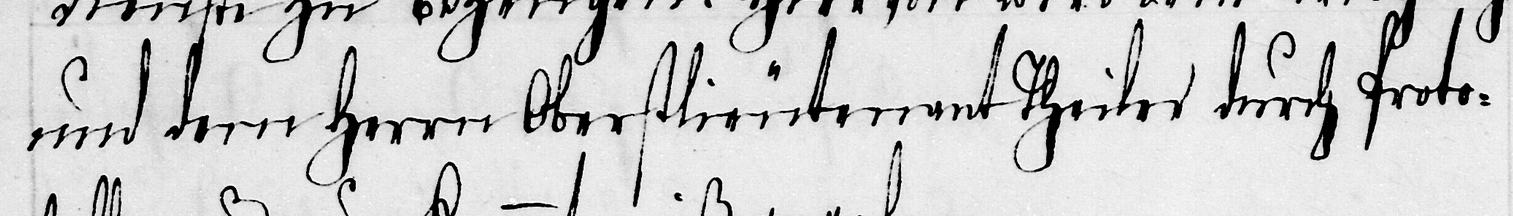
und dem Herrn Oberstlieutenant Theiler durch Proto¬
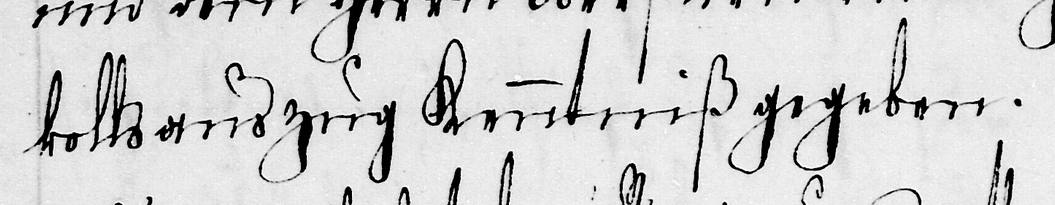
kollsauszug Kenntniß gegeben.
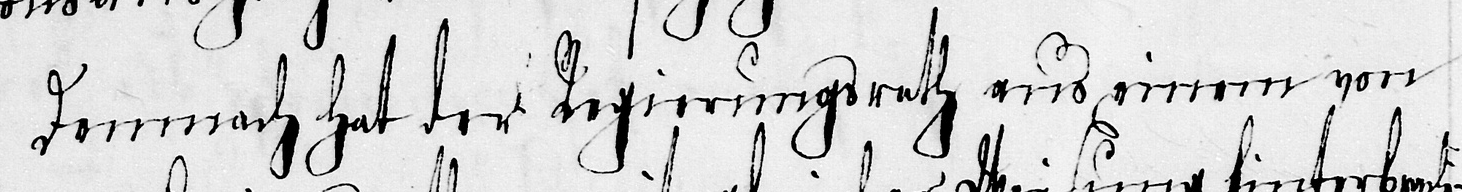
Demnach hat der Regierungsrath aus einem von
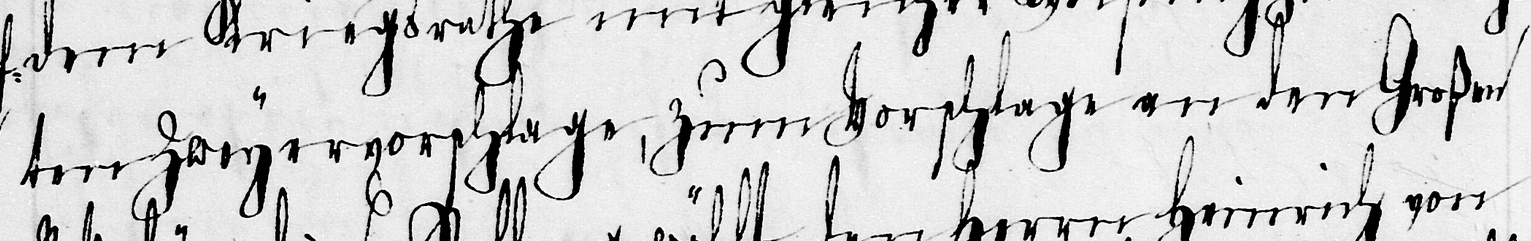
ten Zweyervorschlage, zum Vorschlage an den Großen
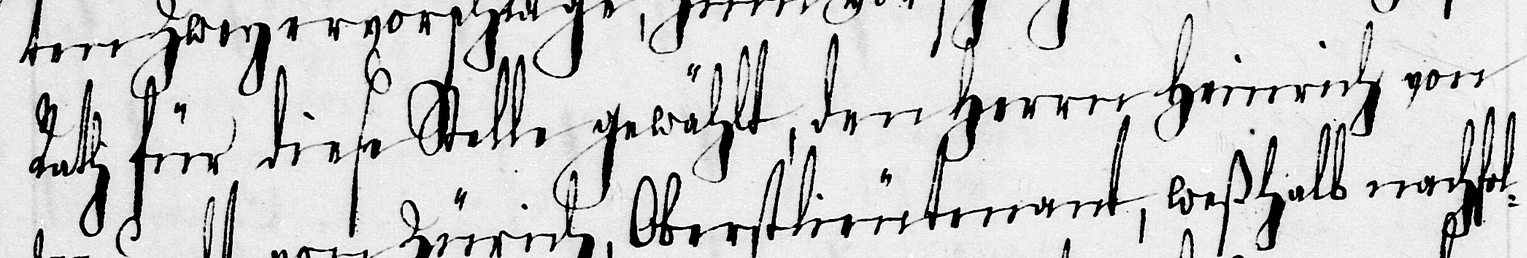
Rath für diese Stelle gewählt, den Herrn Heinrich von
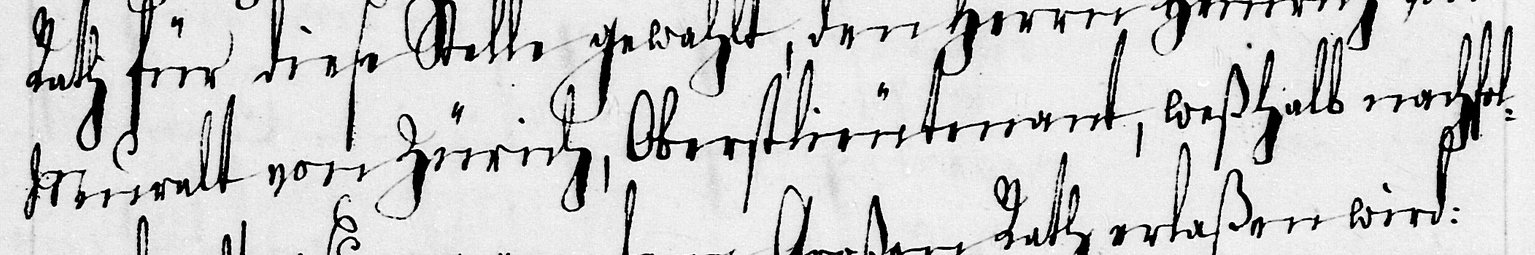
Muralt von Zürich, Oberstlieutenant, weßhalb nachf¬
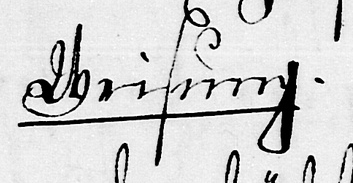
Weisung.
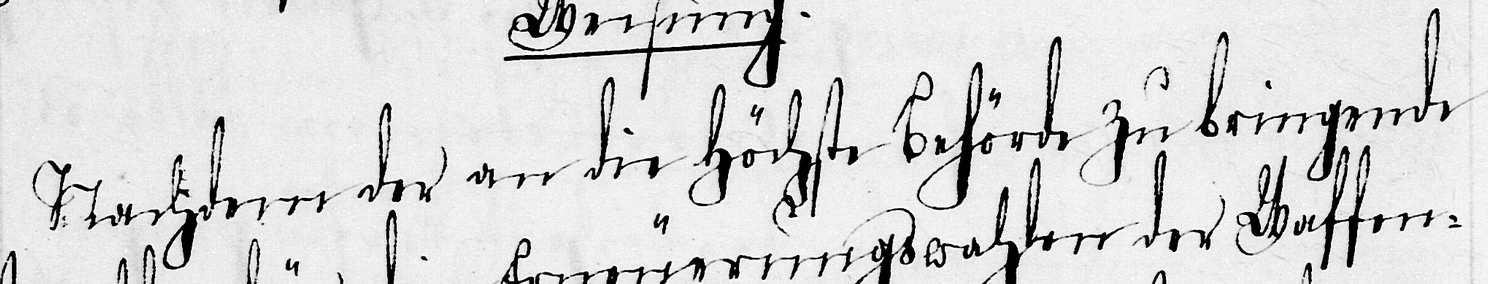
Nachdem der an die Höchste Behörde zu bringende
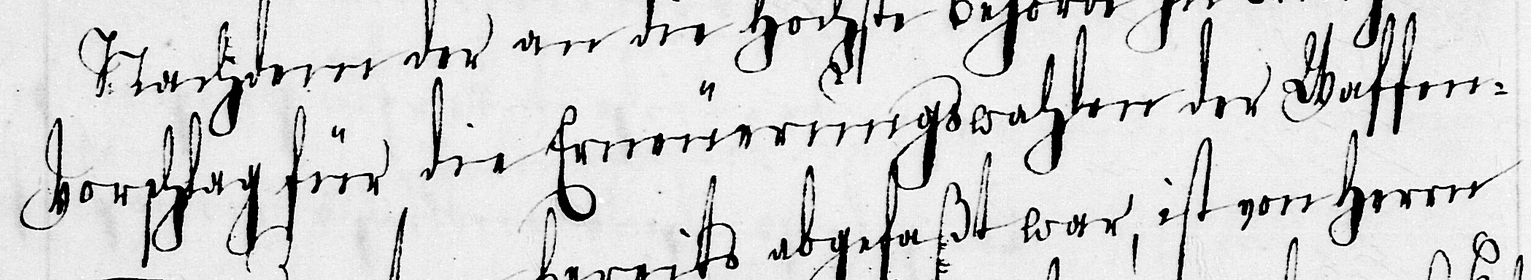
Vorschlag für die Erneuerungswahlen der Waffen¬
